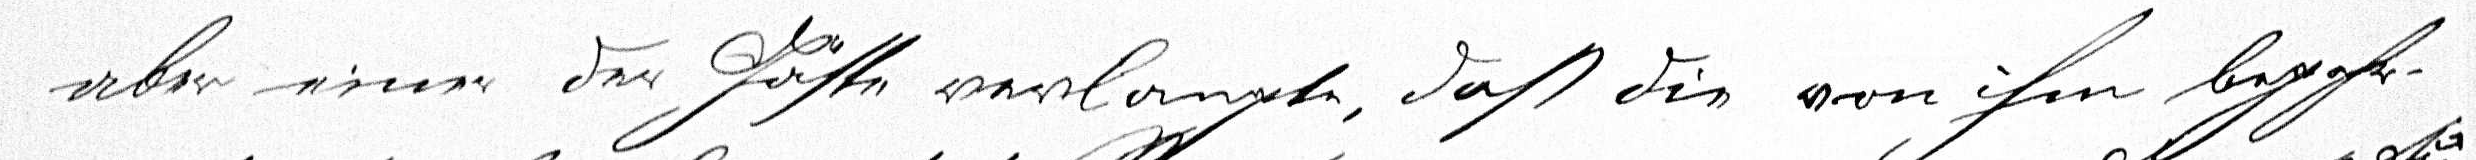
aber einer der Gäste verlangte, daß die von ihm begehr¬
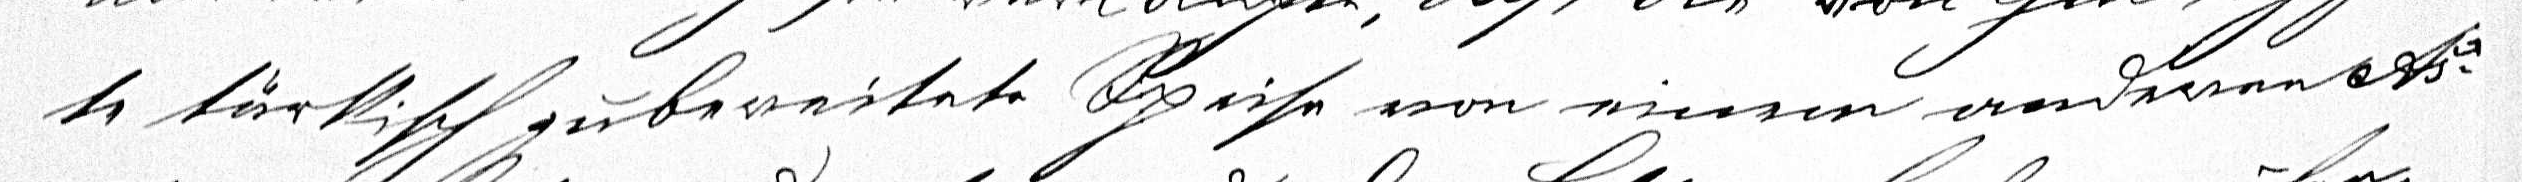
te türkisch zubereitete Speise von einem anderen Aš¬
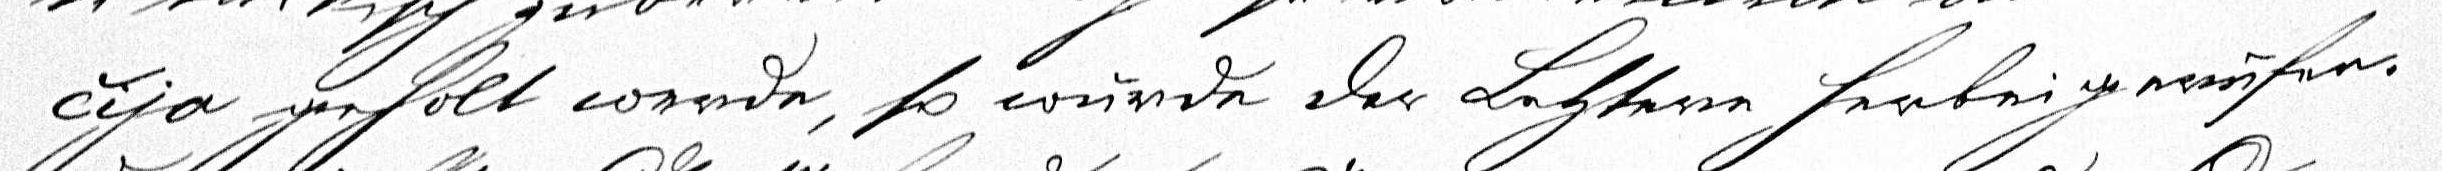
čija geholt werde, so würde der Letztere herbeigerufen.
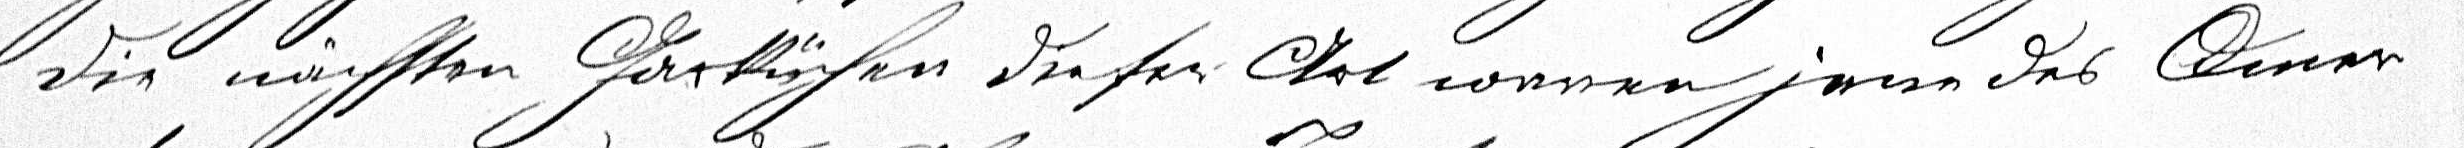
Die nächsten Garküchen dieser Art waren jene des Omar
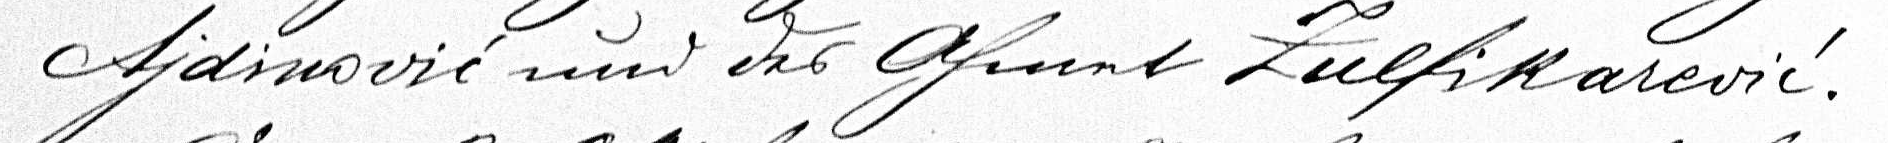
Ajdinović und des Ahmet Zulfikarević.
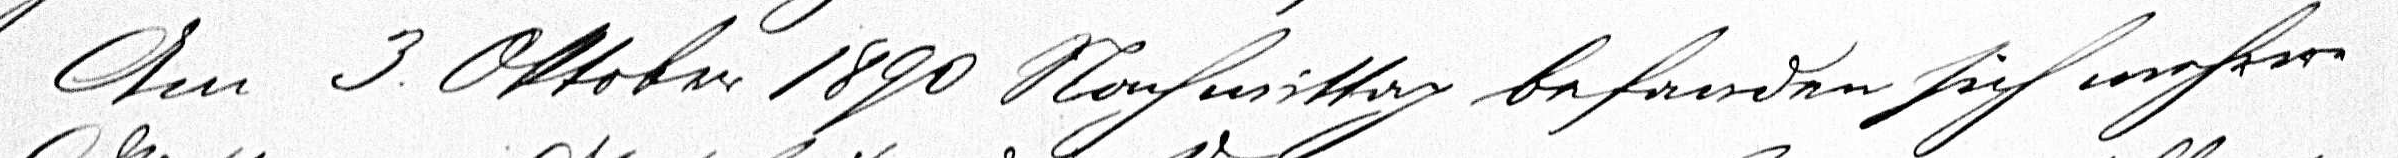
Am 3. Oktober 1890 Nachmittag befanden sich mehrere
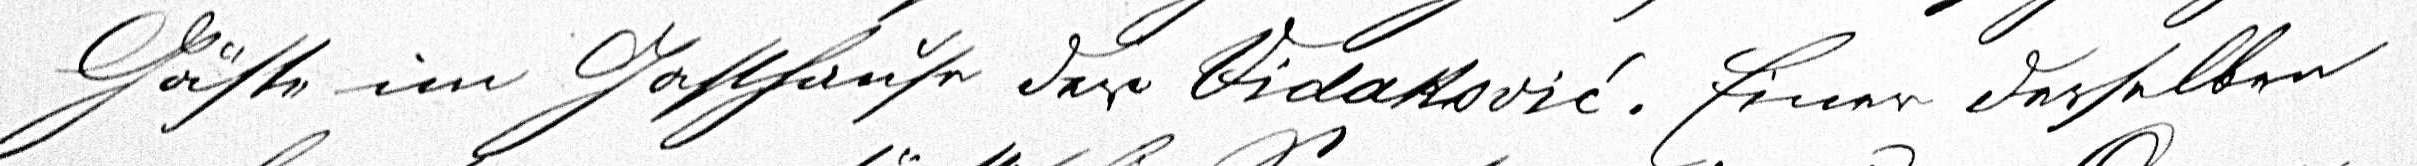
Gäste im Gasthause der Vidaković. Einer derselben
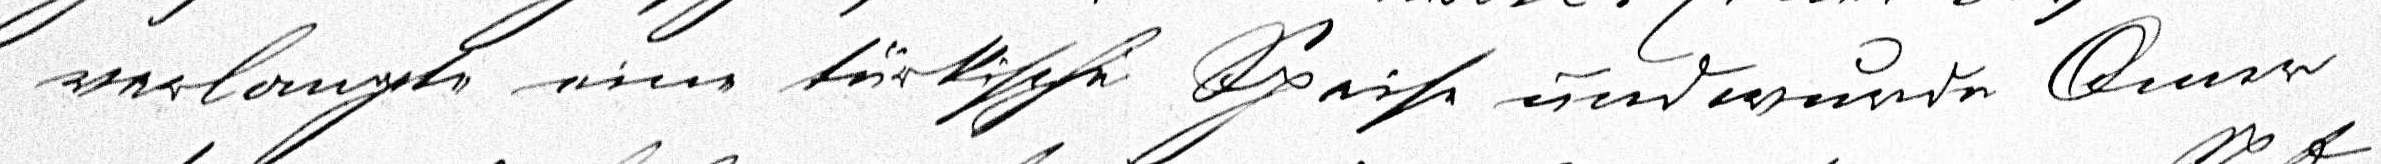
verlangte eine türkische Speise und wurde Omar
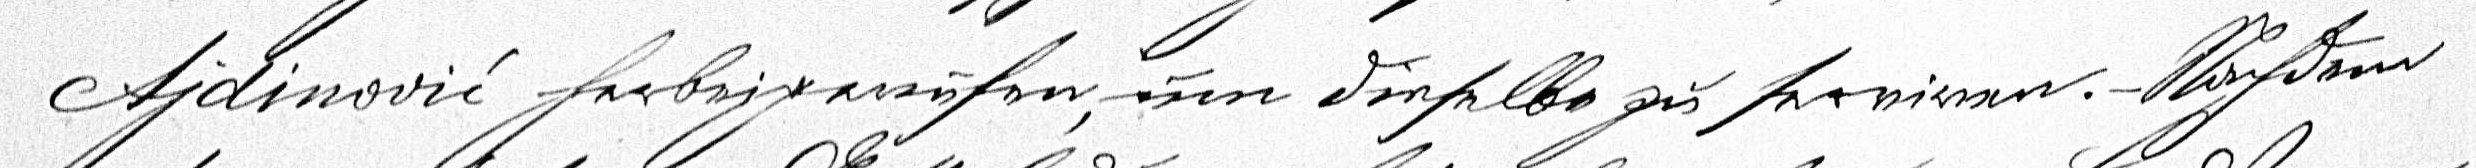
Ajdinović herbeigerufen, um dieselbe zu serviren. Nachdem
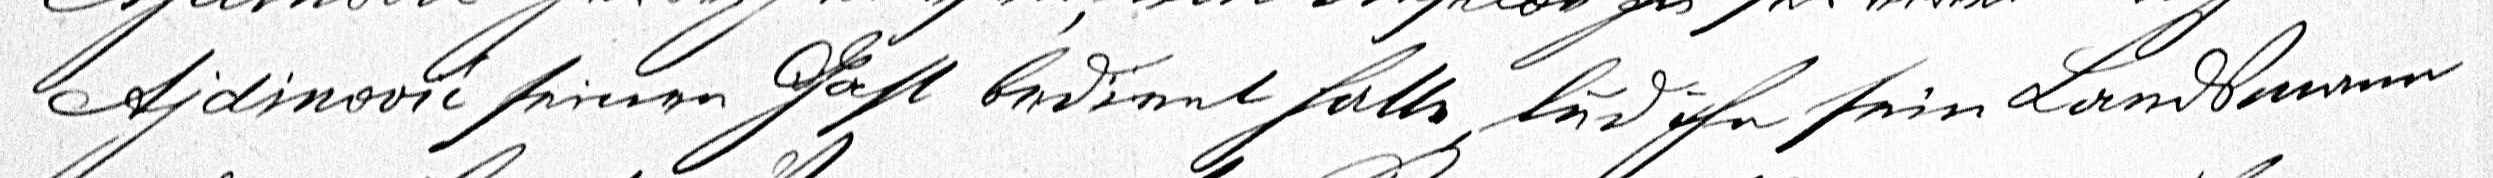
Ajdinović seinen Gast bedient hatte lud ihn sein Landsmann
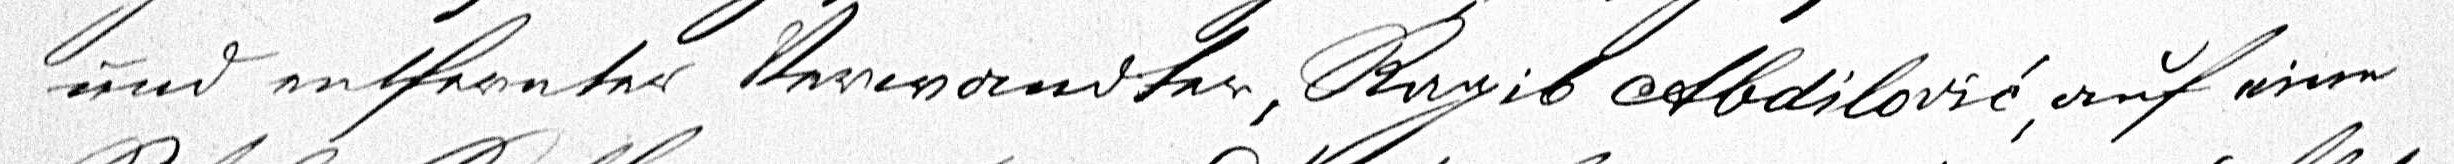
und entfernter Verwandter, Ragib Abdilović, auf eine
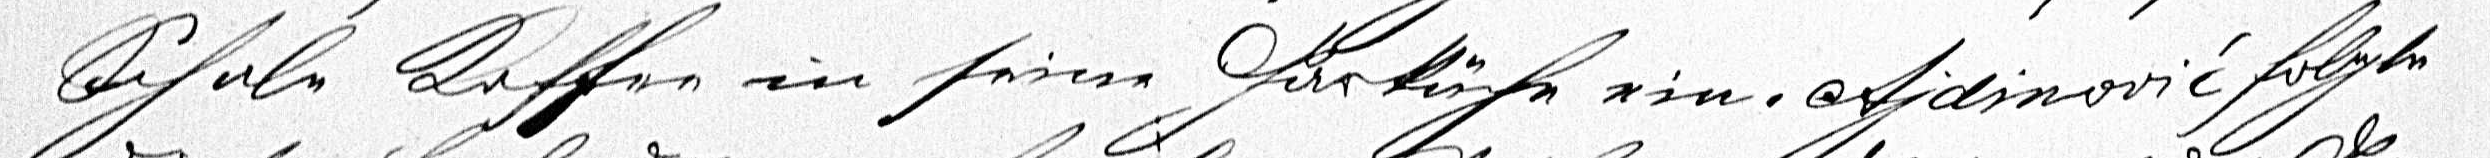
Schale Kaffee in seine Garküche ein. Ajdinović folgte
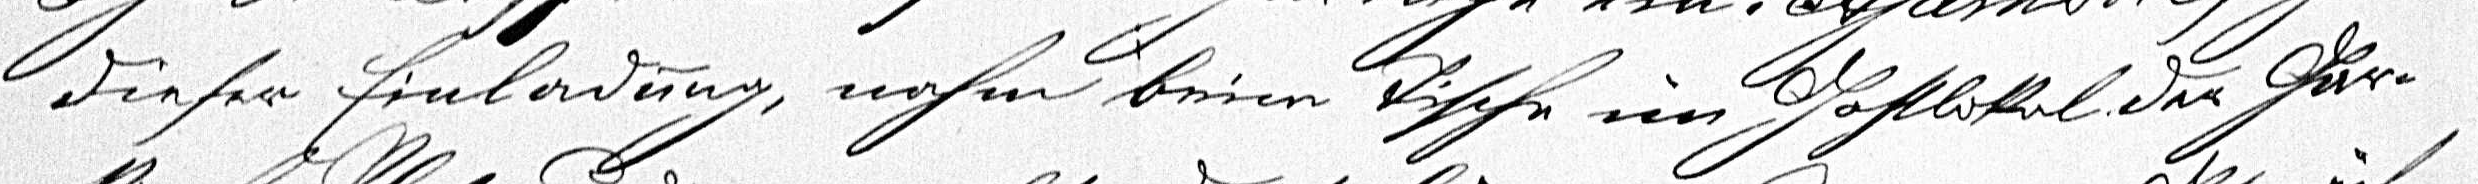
dieser Einladung, nahm beim Tische im Gastlokal der Gar¬
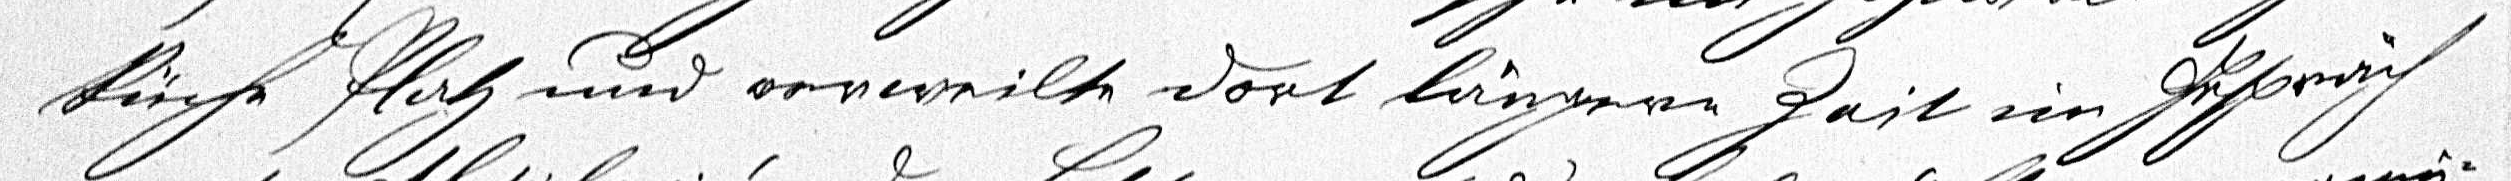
küche Platz und verweilte dort längere Zeit im Gespräch
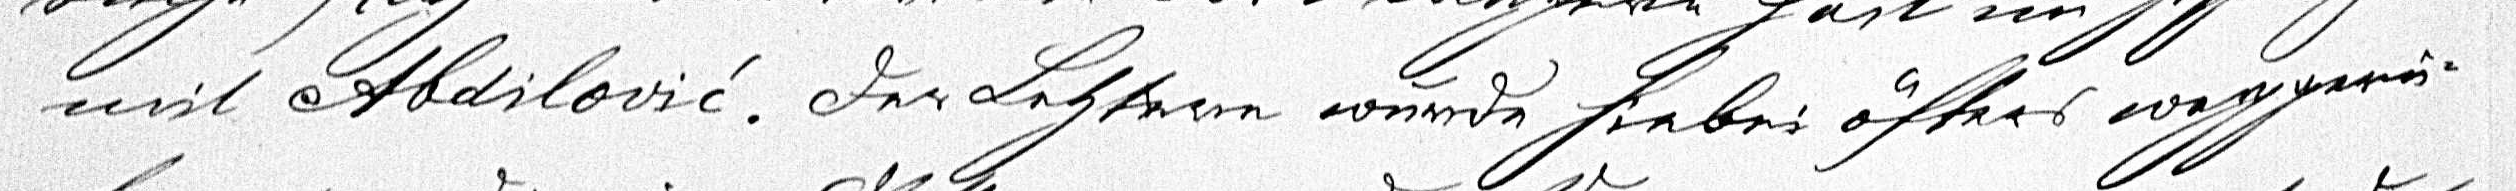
mit Abdilović. Der Letztere wurde hiebei öfters weggeris¬
